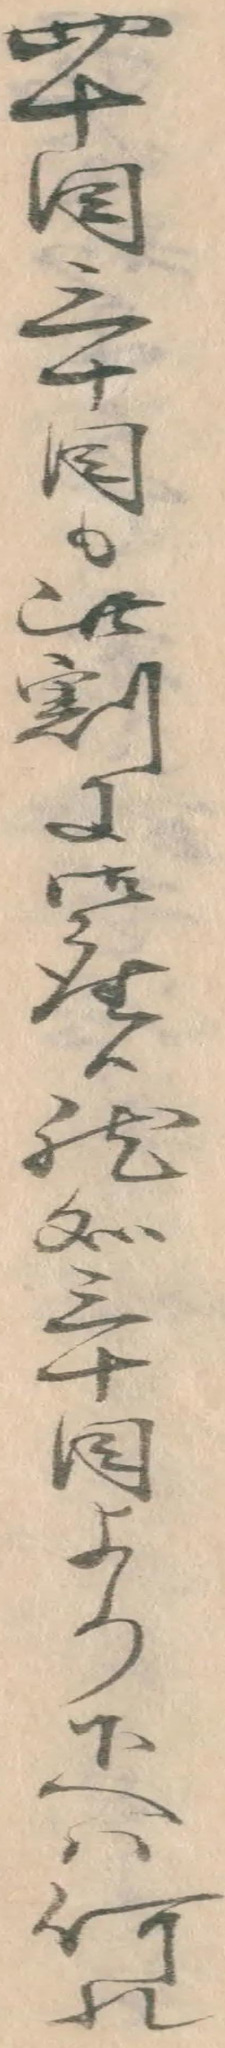四十目三十目も此割に御座候然処三十目より下へは何れ
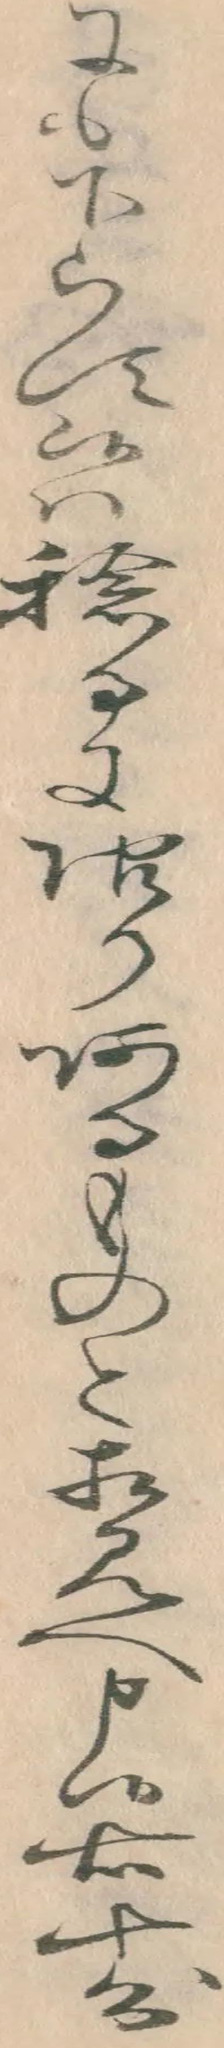にも下らす候は稔るに限りあるものと相見へ申候右十分
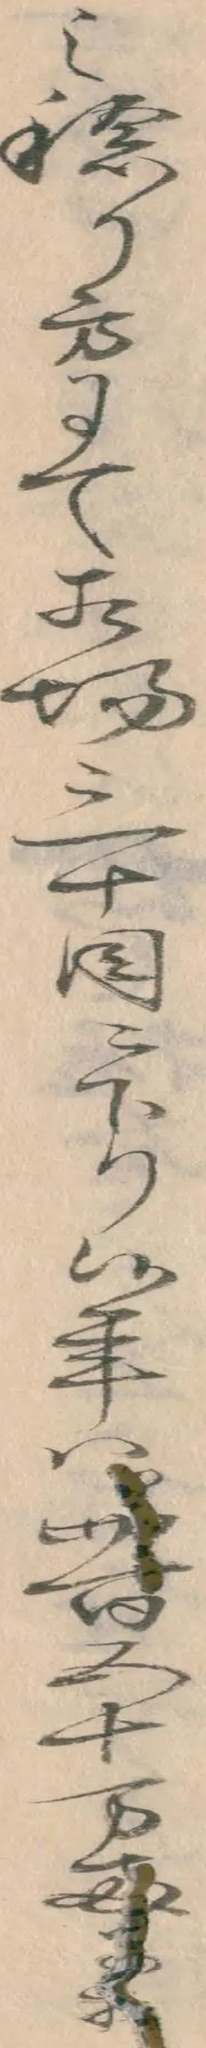之稔り方にて相場三十目に下り候年は。四百五十万両に相
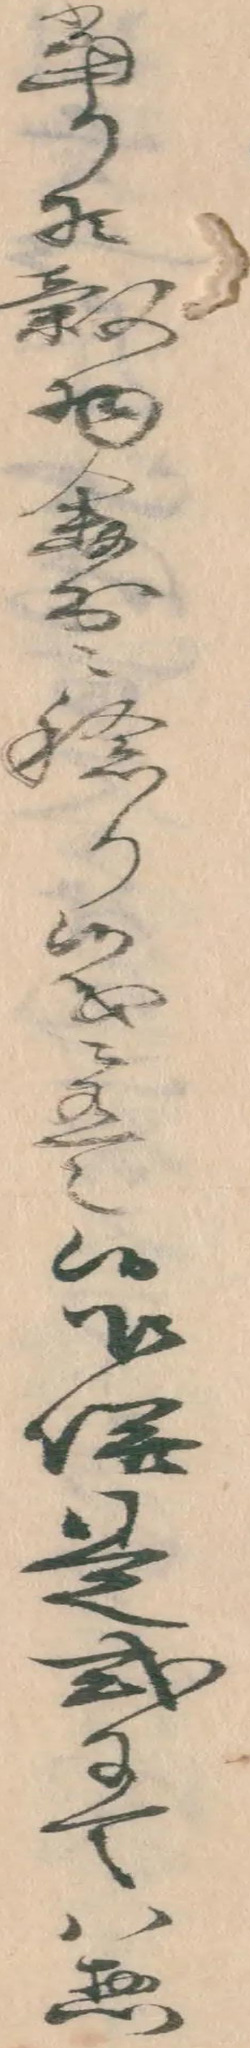当り候穀物余分に稔り候義に有之候乍併是式にては惣
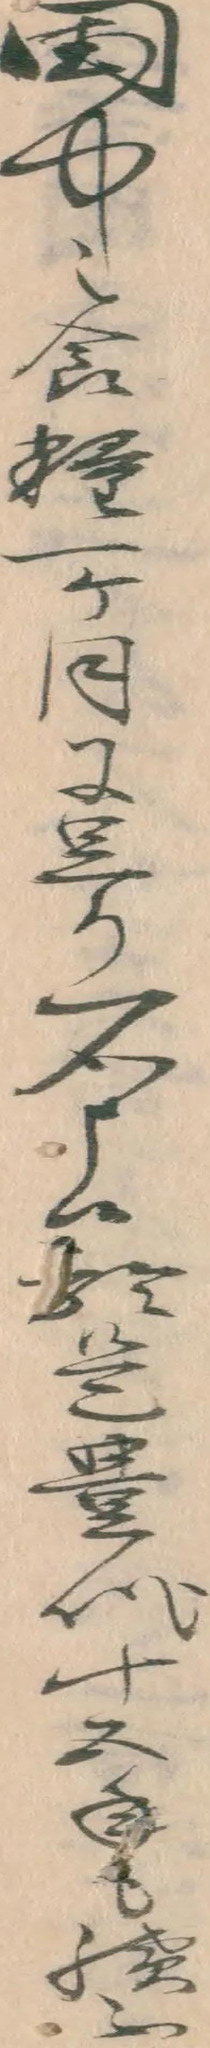国中之食糧一ヶ月に足り不申候於是豊作十五年も続不
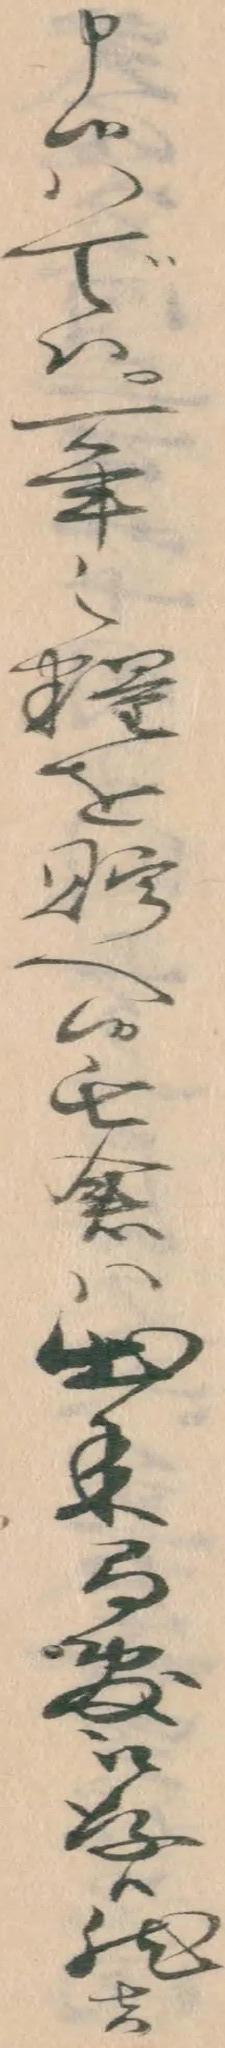申候はでは°一年之糧を貯へ候屯倉は出来間敷被存候然者
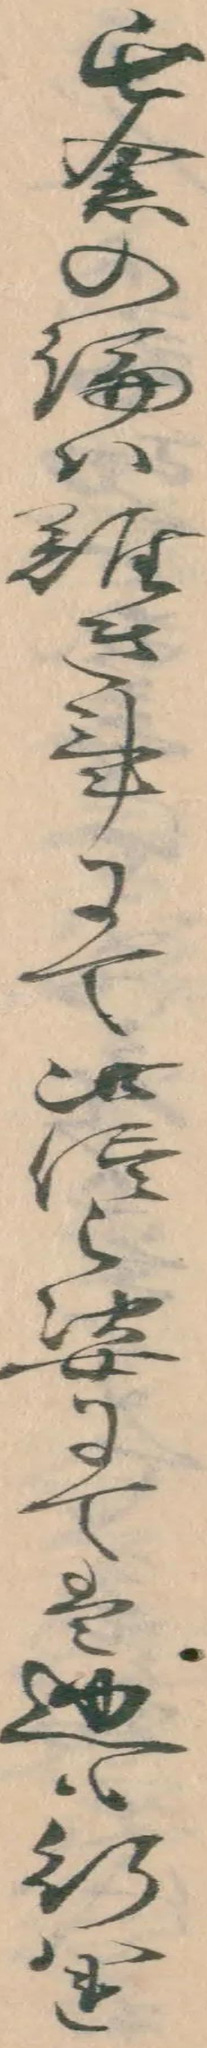屯倉の論は難き事にて此侭之姿にては迚も行はれ
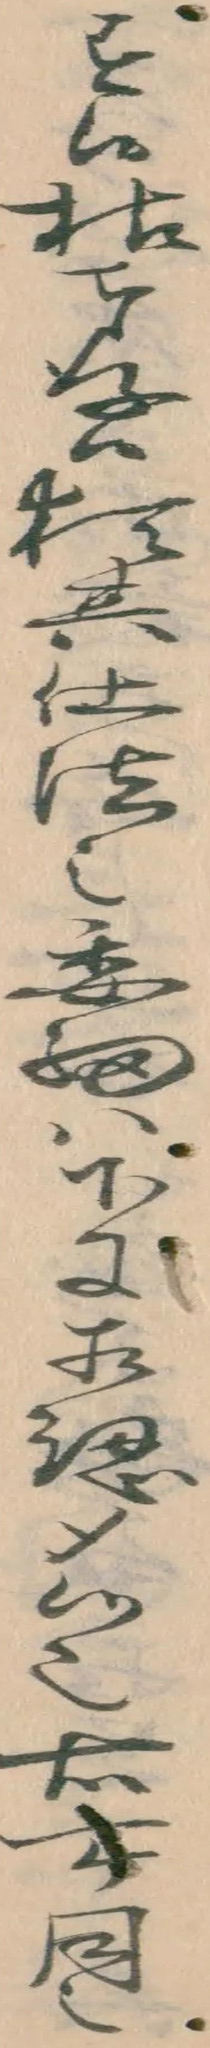す候様奉存候猶其仕法之委細は下に相認め候也右一ヶ月之
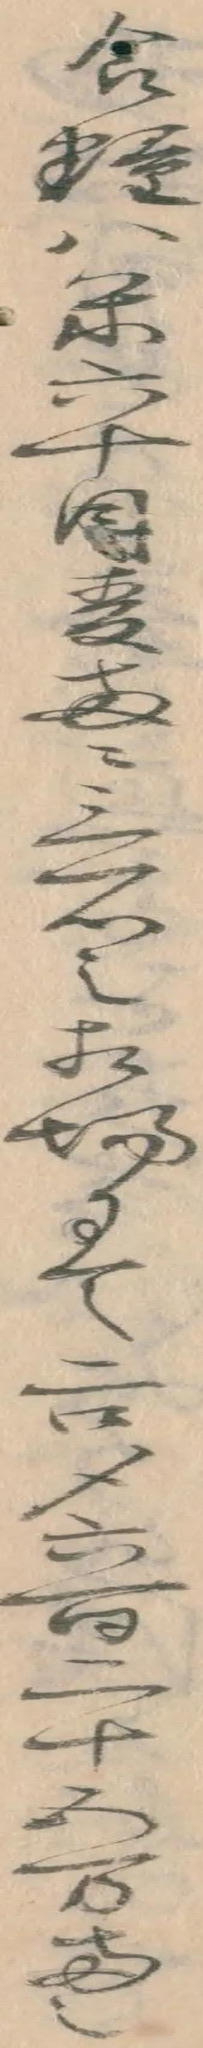食糧は米六十目麦両に三石之相場にて二口〆六百二十五万両之
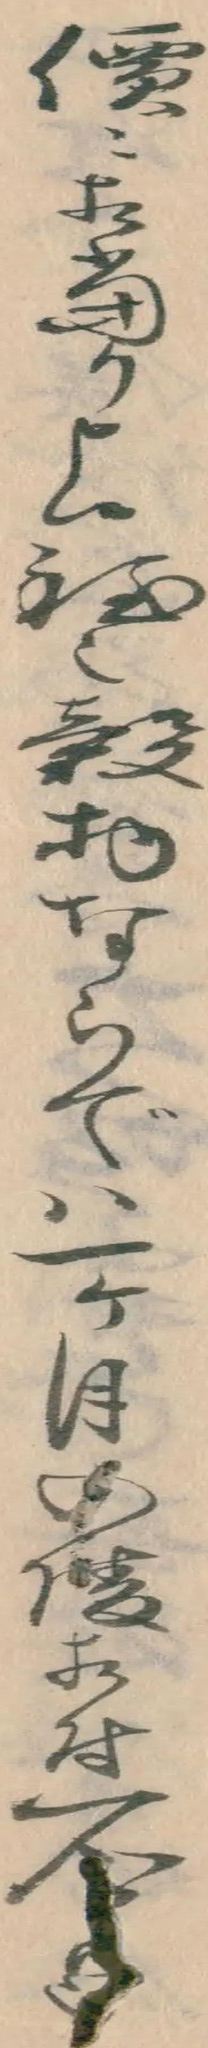価に相当り申候程之穀物ならでは一ヶ月の凌相付不申候也
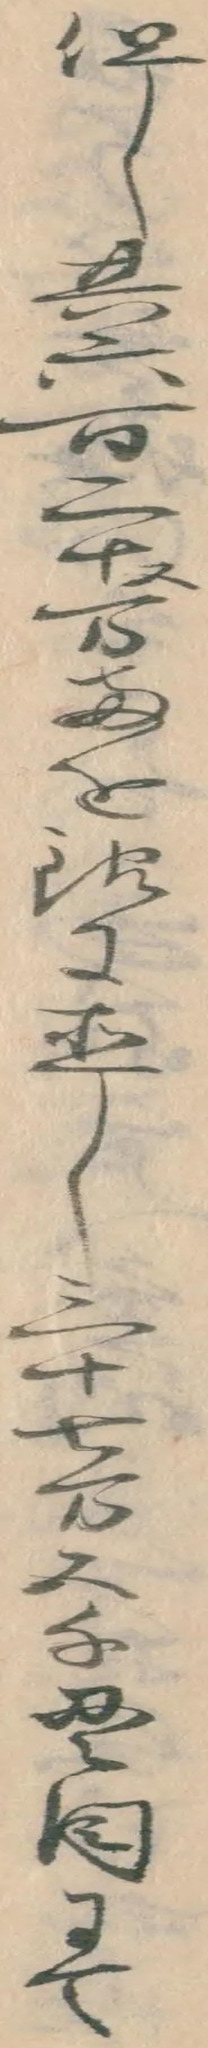但し其六百二十五万両を銀に直し三十七万五千貫目にて
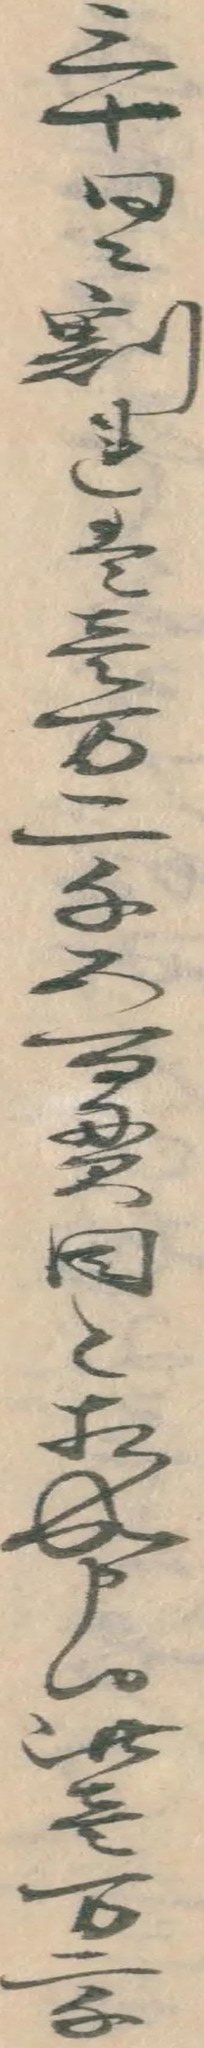三十日に割れは壱万二千五百貫目と相成申候此壱万二千
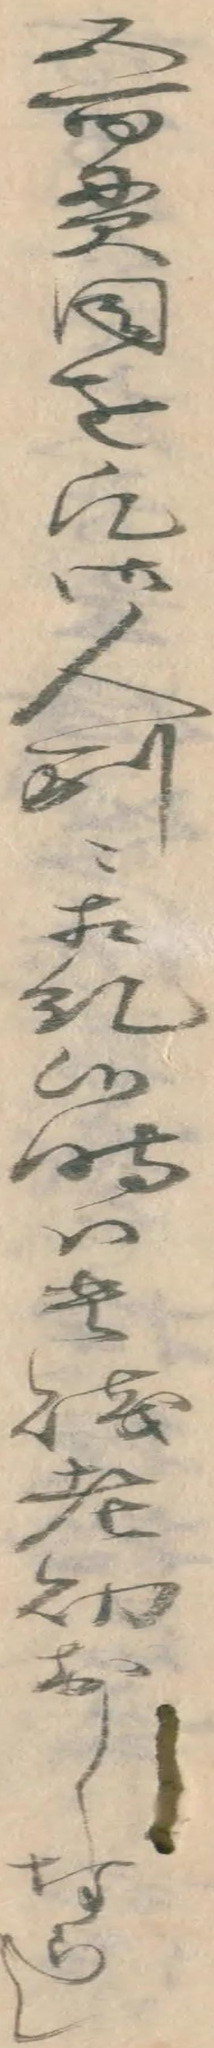五百貫目を凡御人別に相糺候時は貴賤老幼おしならし
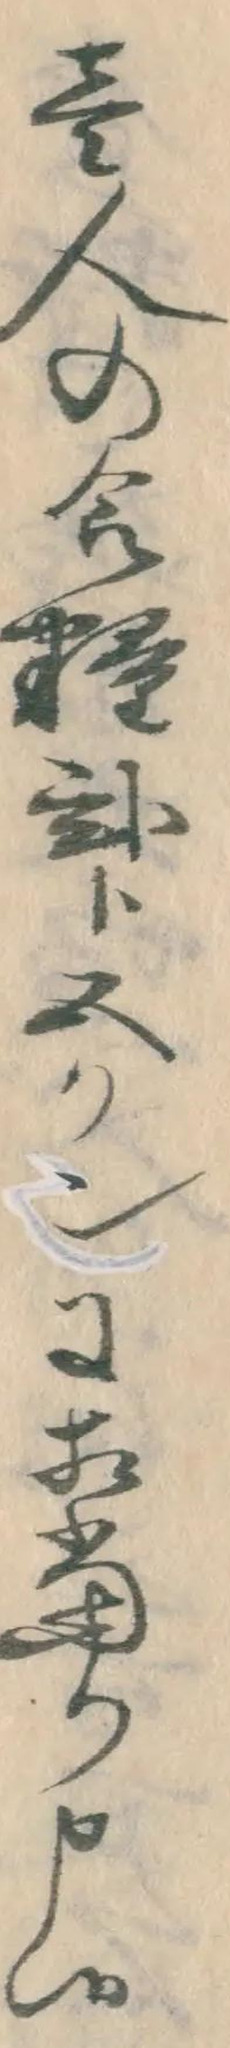壱人の食糧弐分五リンに相当り申候
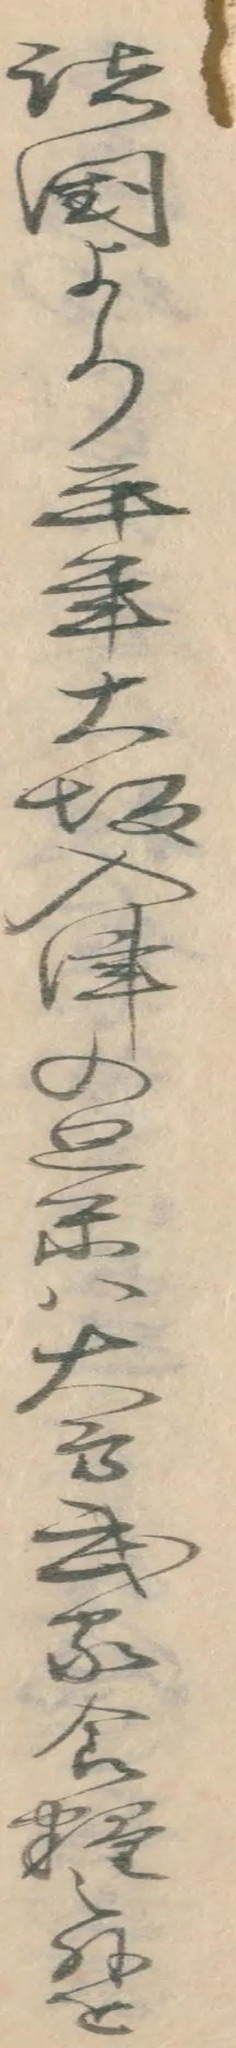一諸国より平年大坂入津の廻米は大方武家食糧之外を
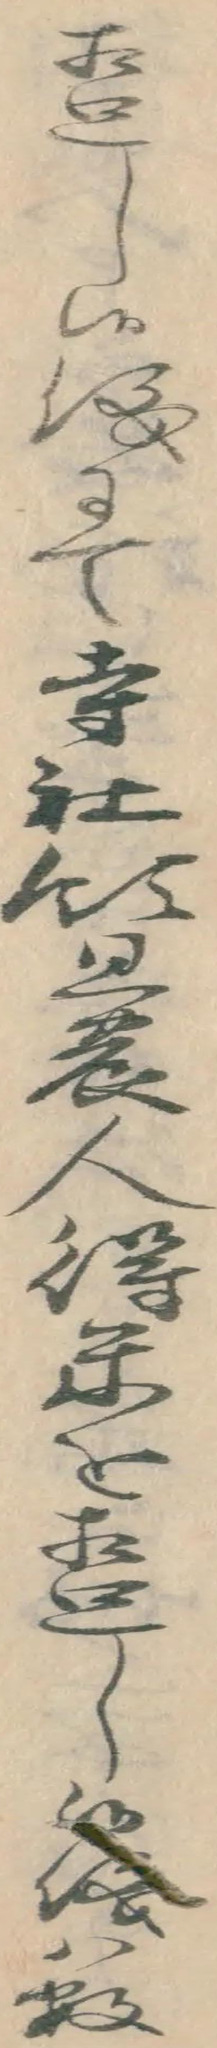相廻し候儀にて寺社領且農人得米を相廻し候儀は数
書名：斎庭之穂
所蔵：国立国会図書館 National Diet Library, JAPAN
